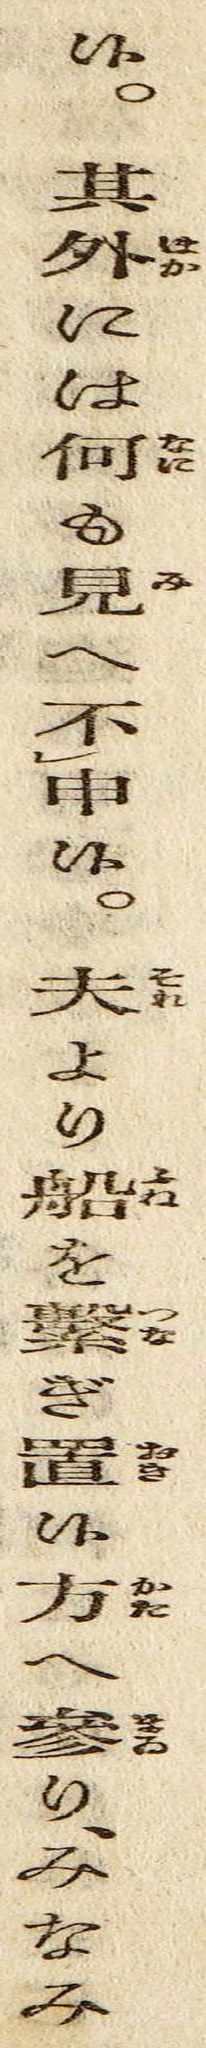候。其外には何も見へ不申候。夫より船を繫ぎ置候方へ参り、みなみ
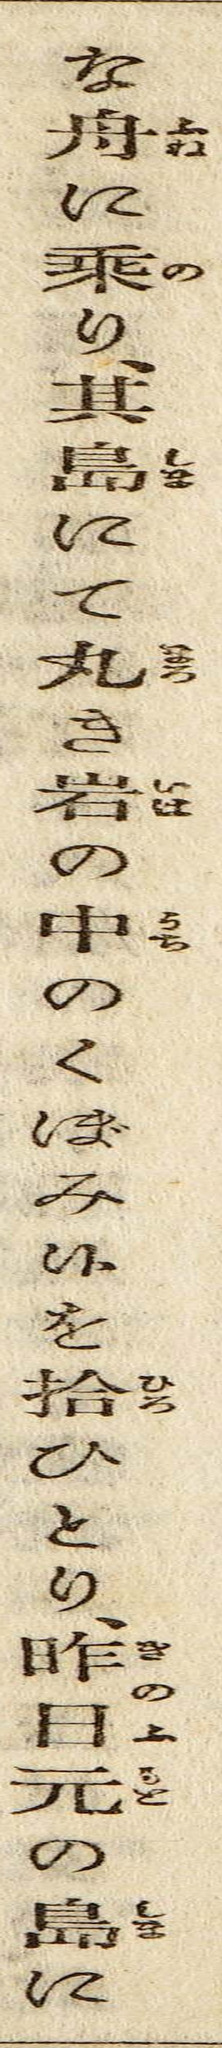な舟に乗り、其島にて丸き岩の中のくぼみ候を拾ひとり、昨日元の島に
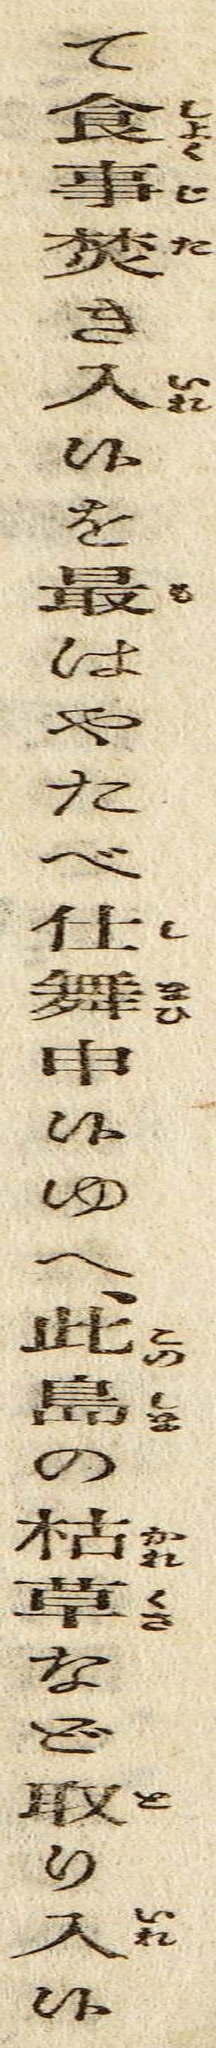て食事焚き入候を最はやたべ仕舞申候ゆへ、此島の枯草など取り入候

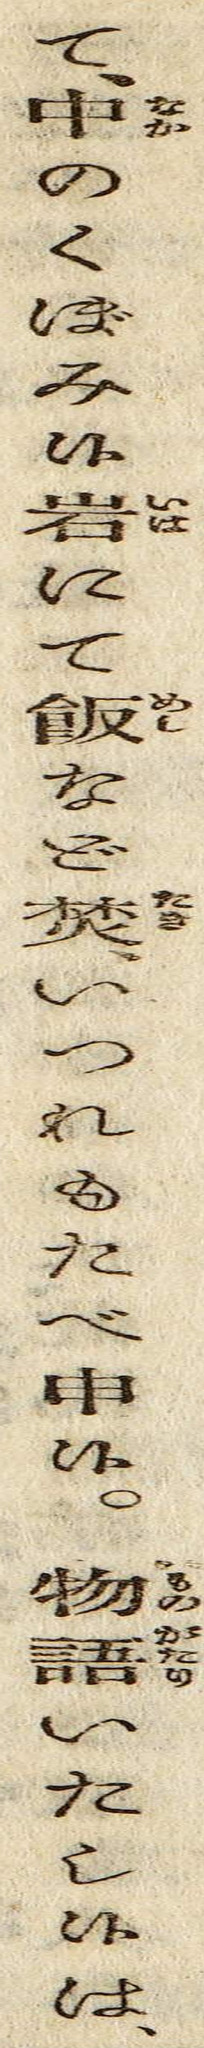て、中のくぼみ候岩にて飯など焚、いつれもたべ申候。物語いたし候は、
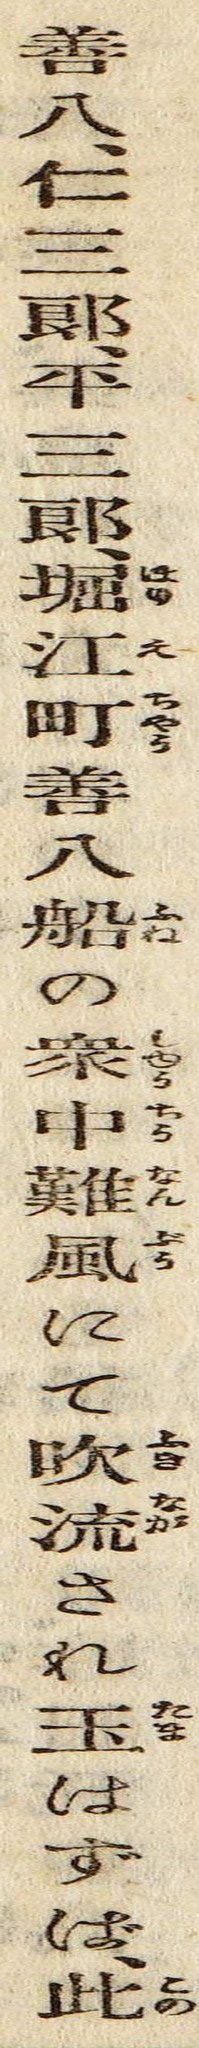善八、仁三郎、平三郎、堀江町善八船の衆中難風にて吹流され玉はずば、此
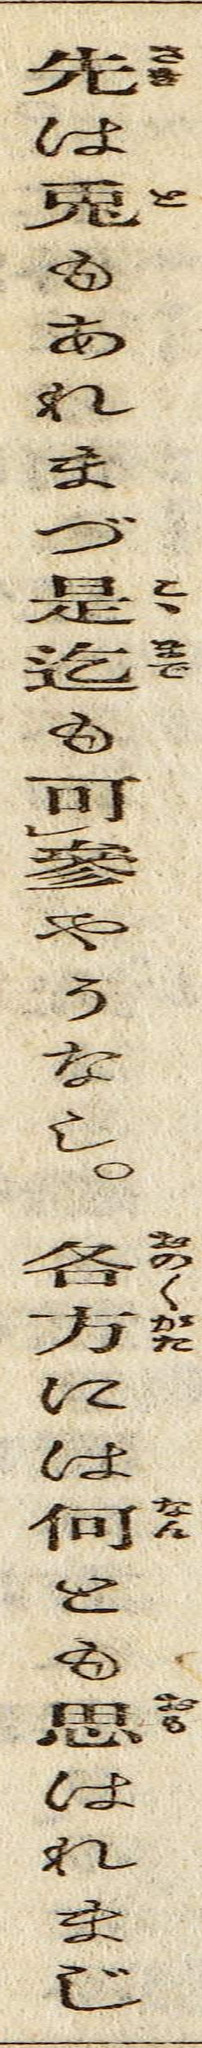先は兎もあれまづ是迄も可参やうなし。各方には何とも思はれまじ
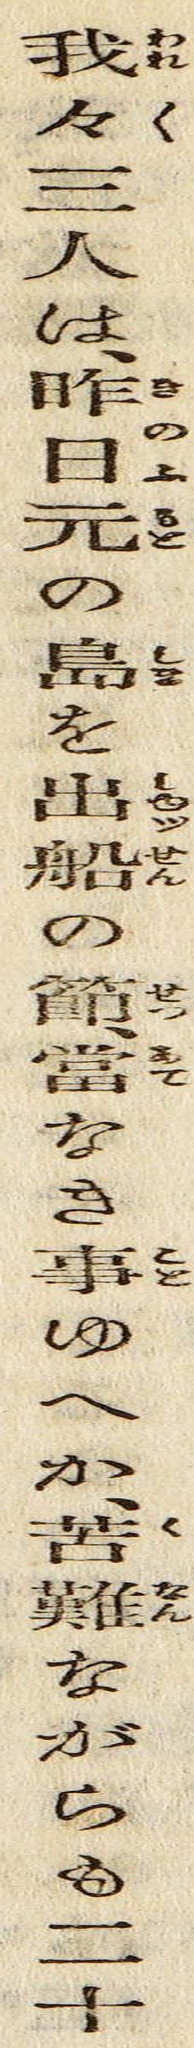我々三人は、昨日元の島を出船の節、当なき事ゆへか、苦難ながらも二十
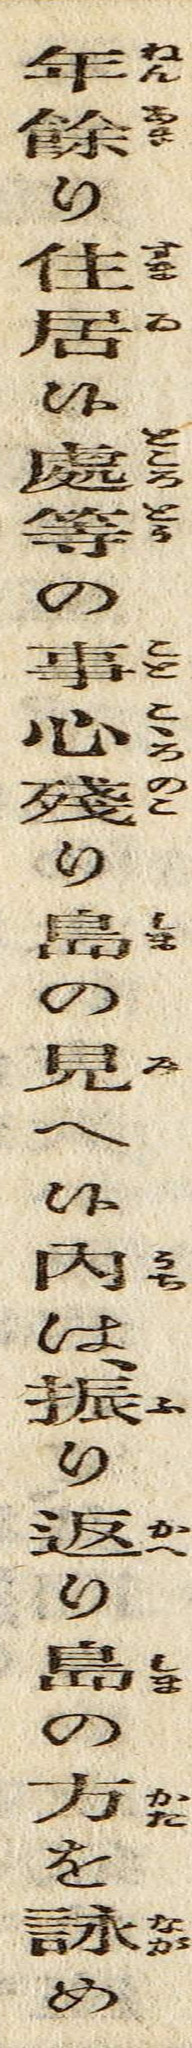年余り住居候処等の事心残り島の見へ候内は、振り返り島の方を詠め
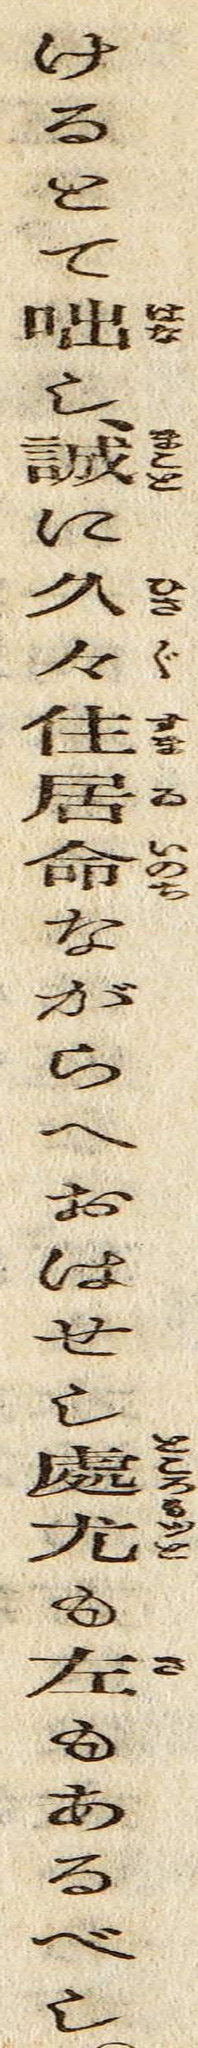けるとて咄し、誠に久々住居命ながらへおはせし処尤も左もあるべし。
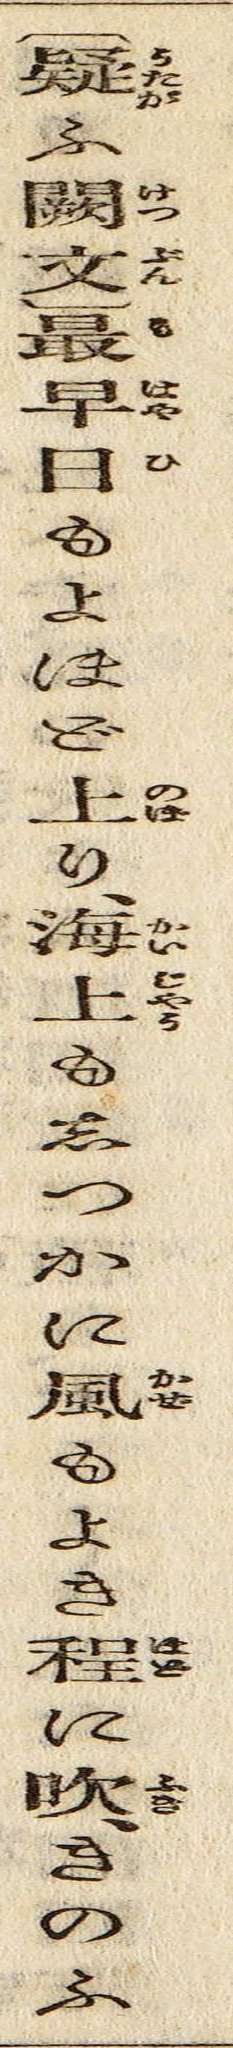[疑ふ闕文]最早日もよほど上り、海上もしつかに風もよき程に吹、きのふ
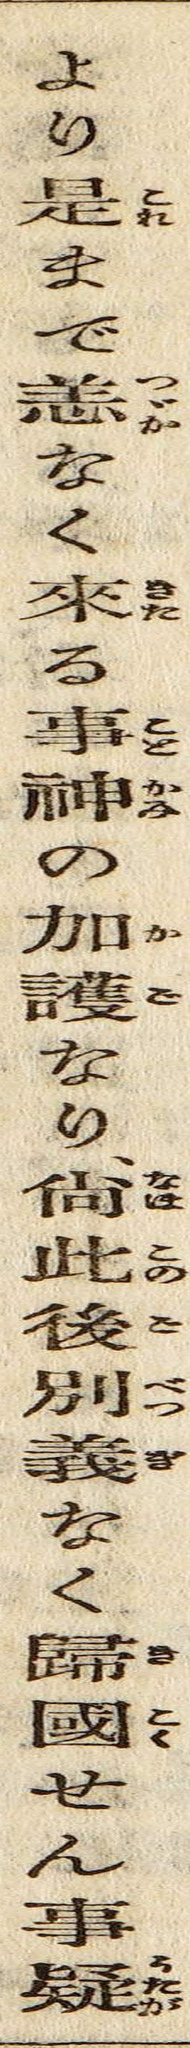より是まで恙なく来る事神の加護なり、尚此後別義なく帰国せん事疑
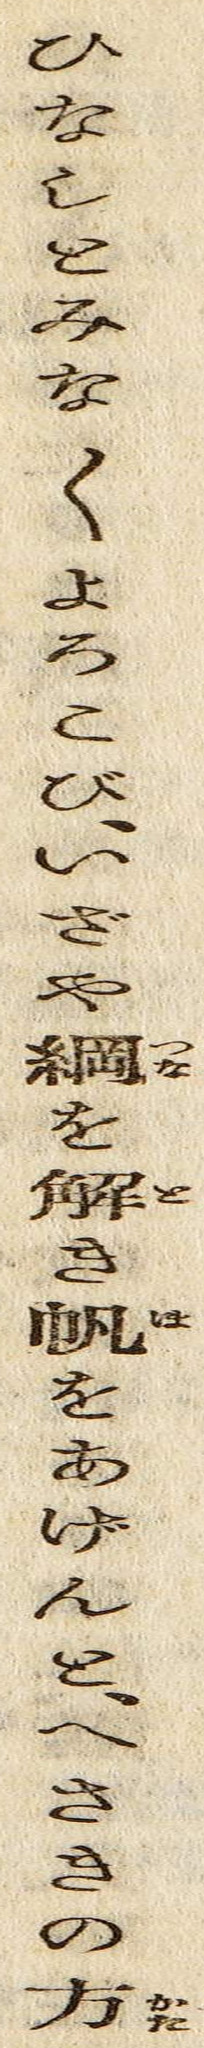ひなしとみな〳〵よろこび、いざや綱を解き帆をあげんと、へさきの方
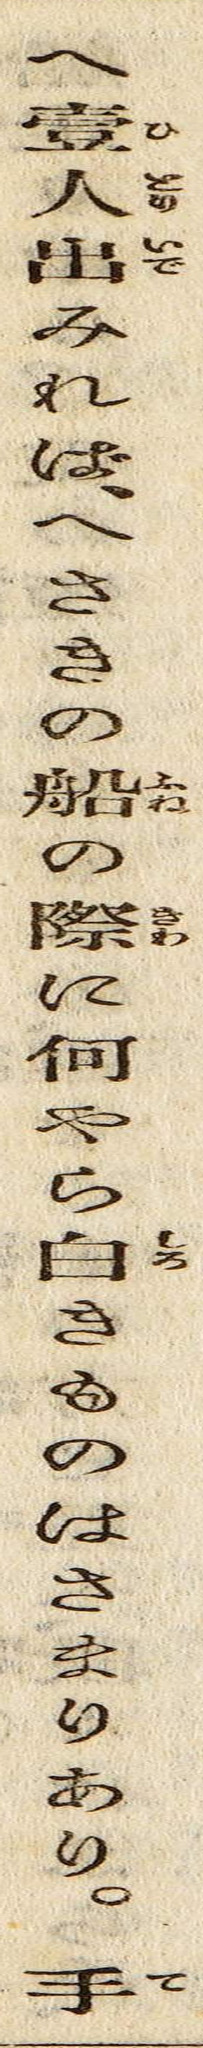へ壱人出みれば、へさきの船の際に何やら白きものはさまりあり。手
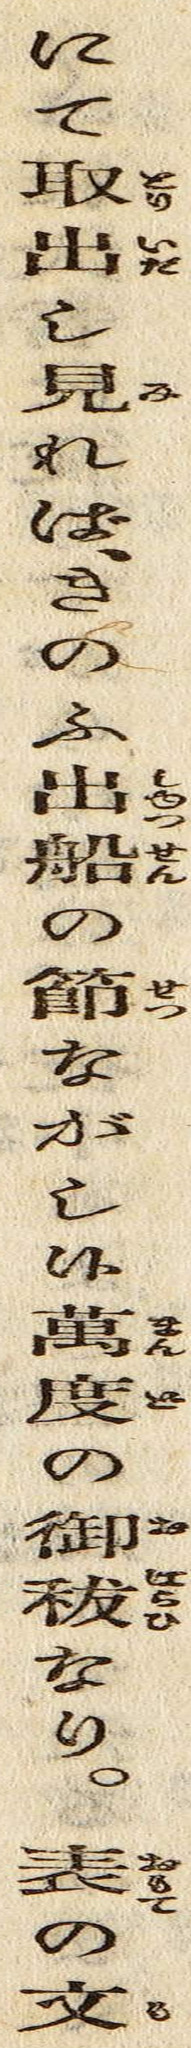にて取出し見れば、きのふ出船の節ながし候万度の御祓なり。表の文
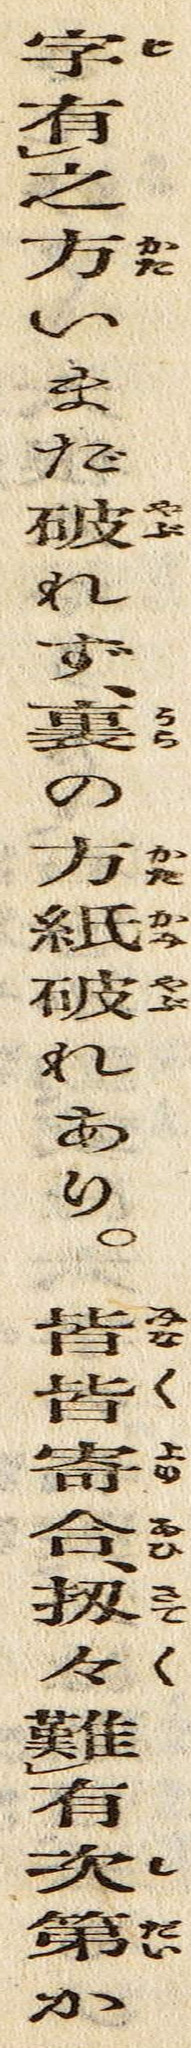字有之方いまだ破れず、裏の方紙破れあり。皆皆寄合、扨々難有次第か
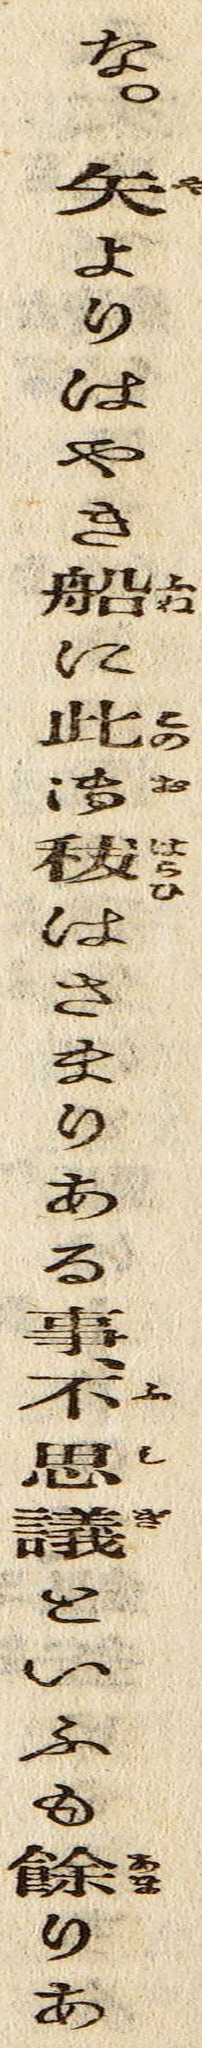な。矢よりはやき船に此御祓はさまりある事、不思議といふも余りあ
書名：日本漂流譚
